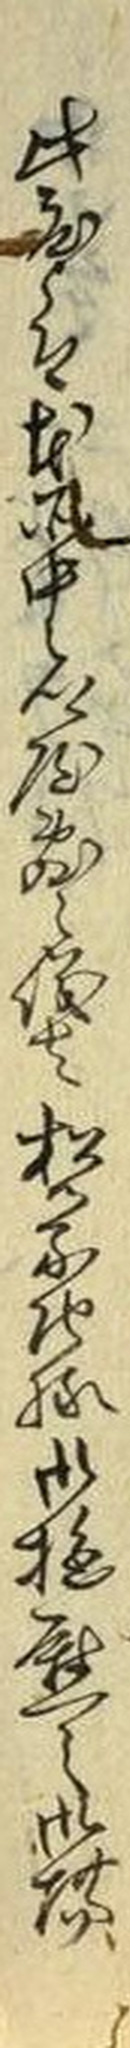此度被下候本所中之郷屋敷之儀者松栄院様御遊慰之御場
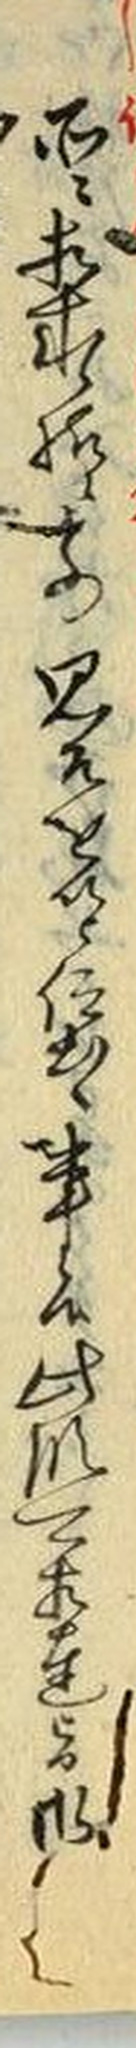所ニ相成候様ニとの思召を以被仰出候事候此段可相達旨御
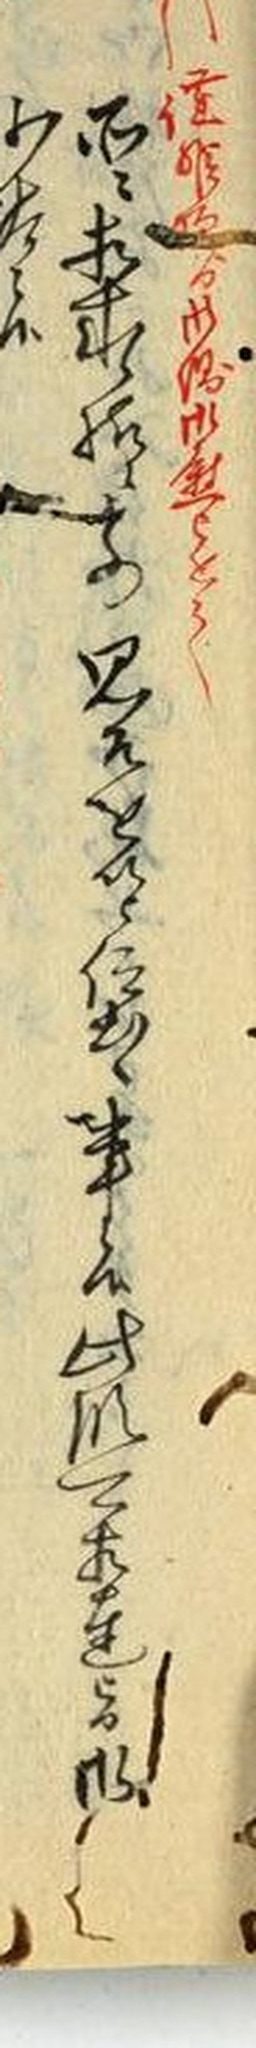所ニ相成候様ニとの思召を以被仰出候事候此段可相達旨御
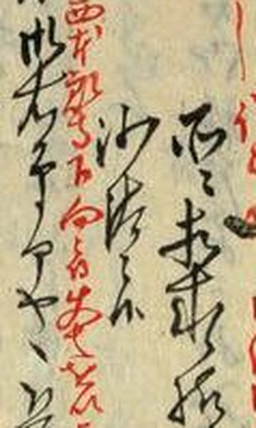沙汰ニ候
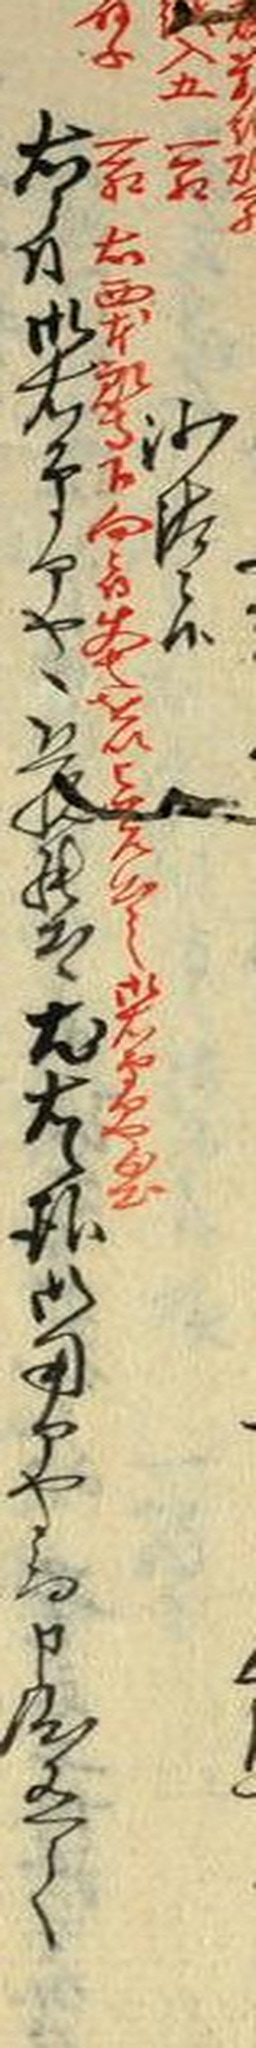右ニ付御右筆部やへ恐悦罷出候尤右之趣御用部やニ而申渡有之
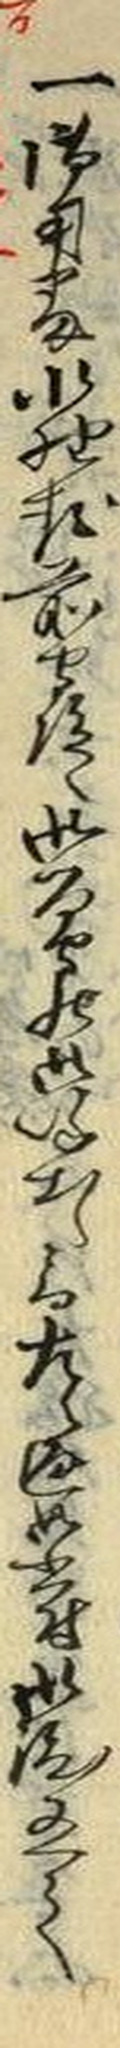一御用番水野越前守殿へ御留守居御呼出しニ而左之通御書付御渡有之
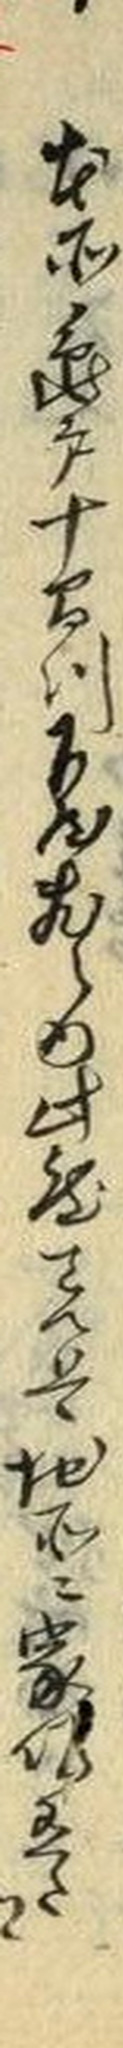本所亀戸十間川下屋敷之内此度差上候地所ニ家作有候ハヽ
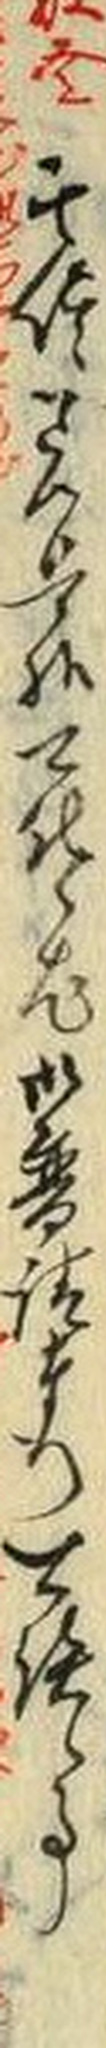其侭差上候様可仕候尤御普請奉行可談候事
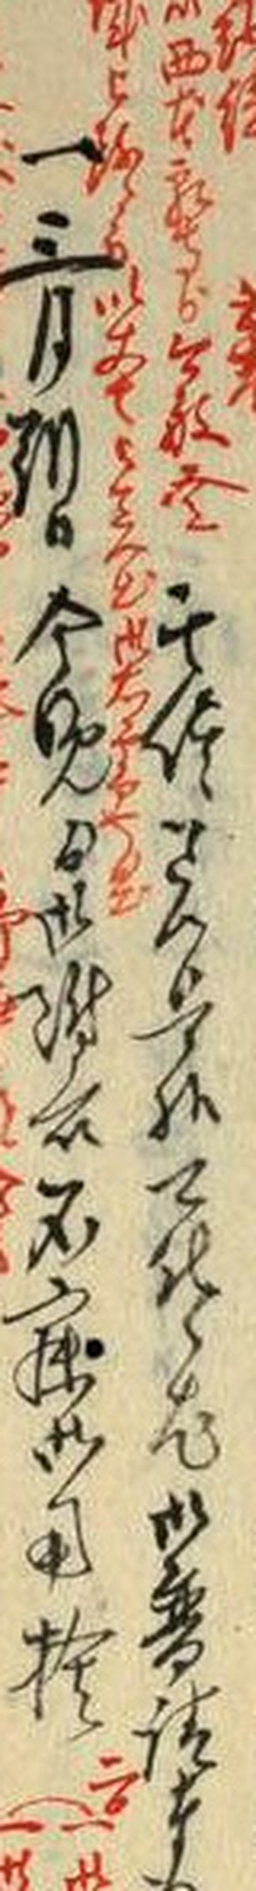一三月朔日今晩ゟ御附衆不寐御用捨
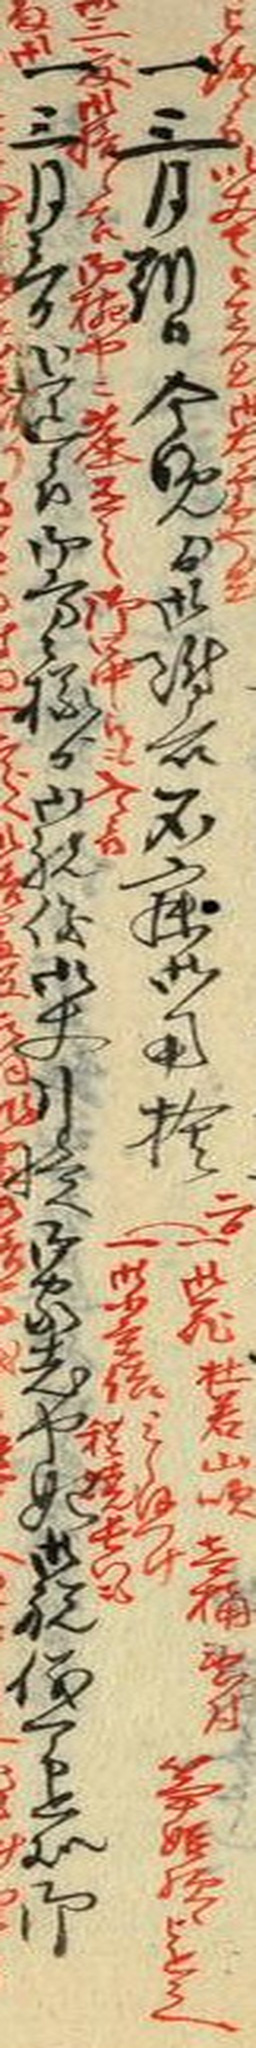一三月三日上巳ニ付御方々様ゟ御祝儀御使引続御家老中始御祝儀可申上候処御
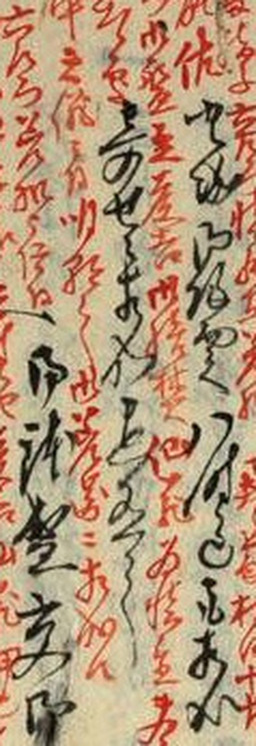寄せニ相成申上有之
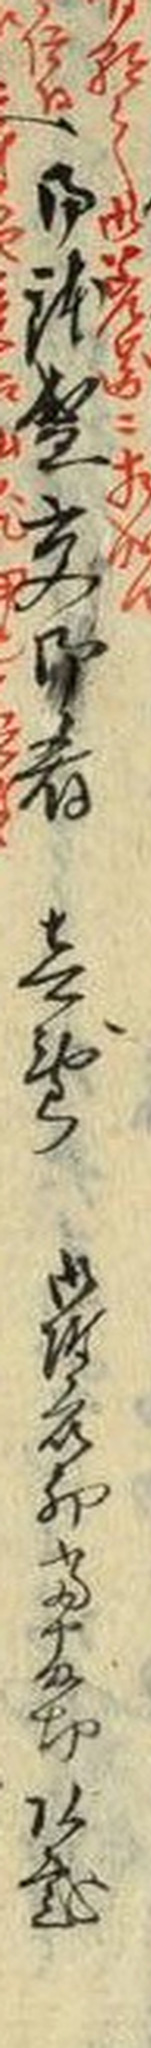御鉢盛交御肴壱台御附衆初両番切頂戴
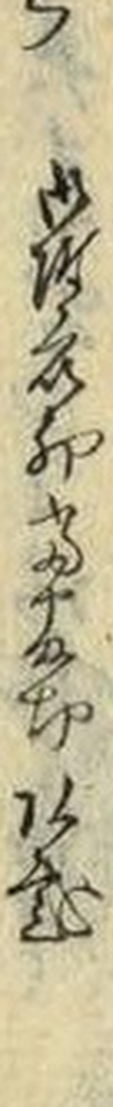菱餅御附衆初両番頂戴
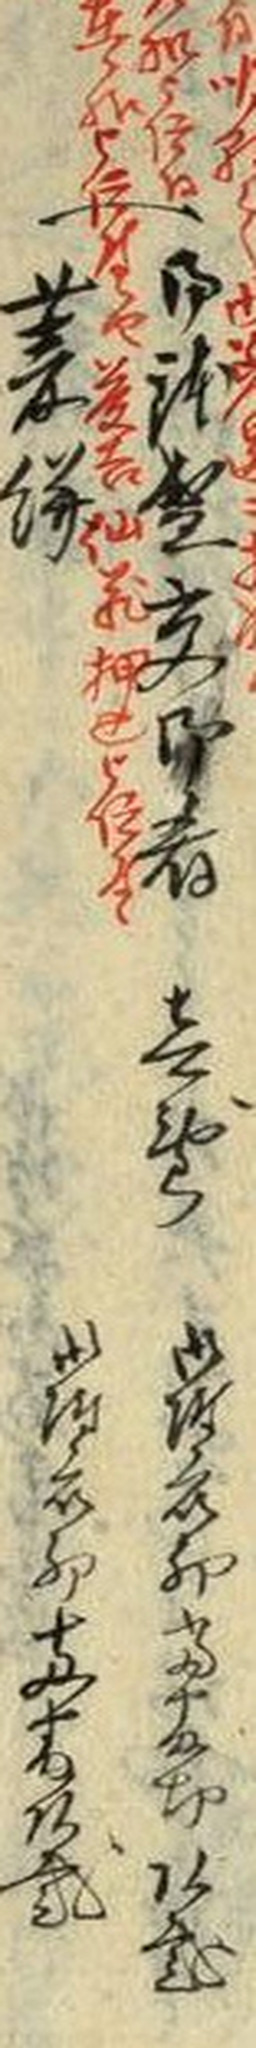菱餅御附衆初両番頂戴
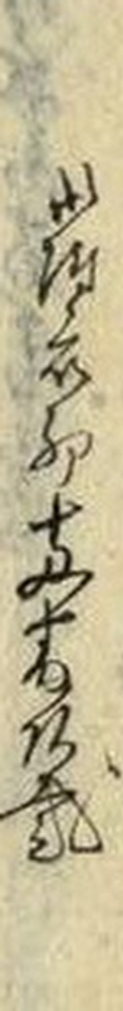菱餅御附衆初両番頂戴
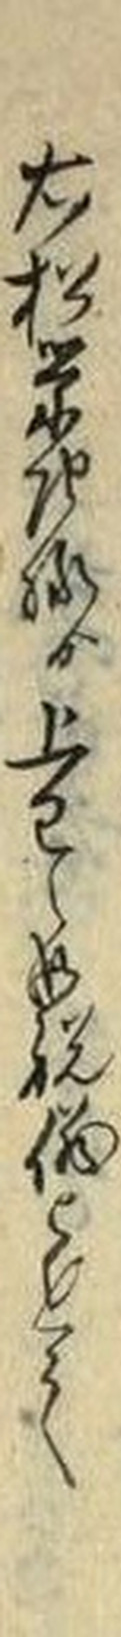右松栄院様ゟ上巳之御祝儀被進之
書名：少傅日録抄（斉善付側向頭取日記、江戸并道中、初入在国、逝去後…
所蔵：福井県文書館 Fukui Prefectural Archives
